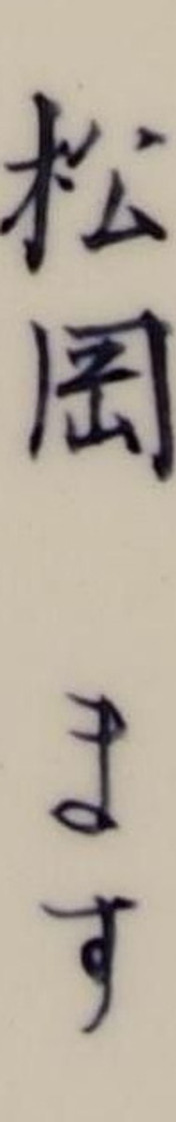松岡ます
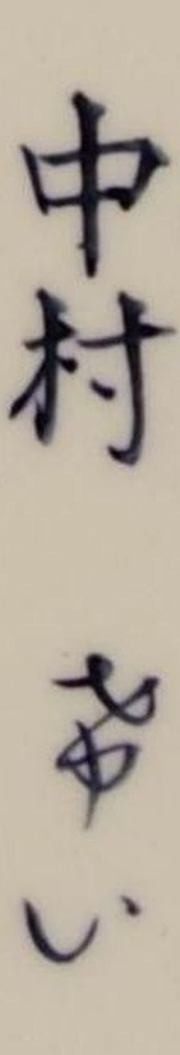中村けい
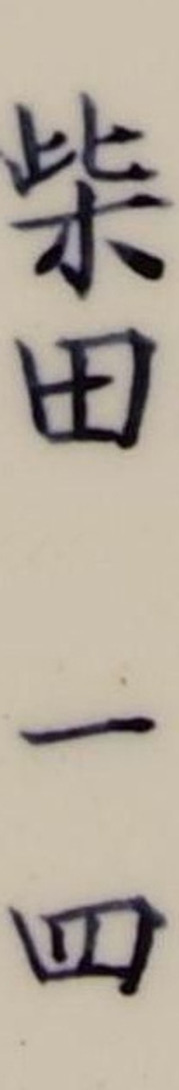柴田一四
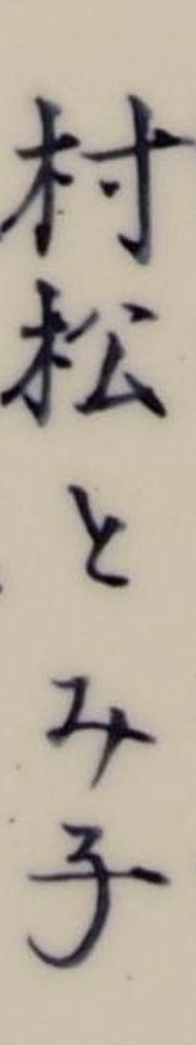村松とみ子
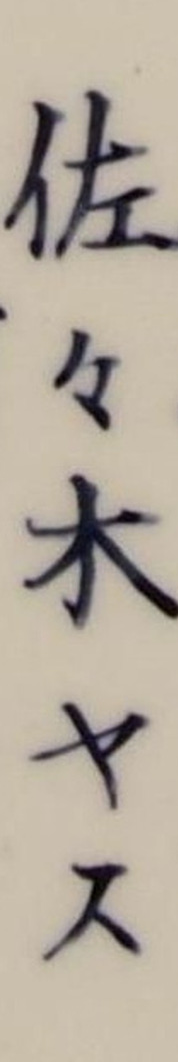佐々木ヤス
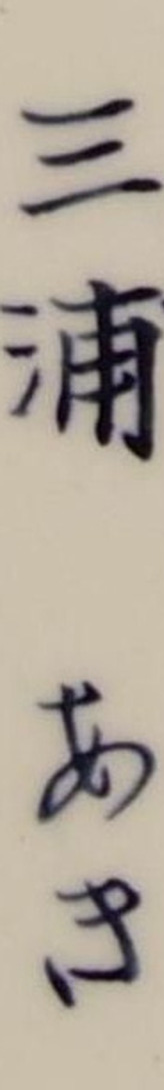三浦あき
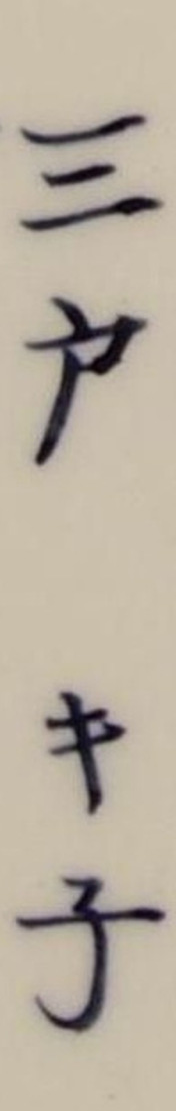三戸キ子
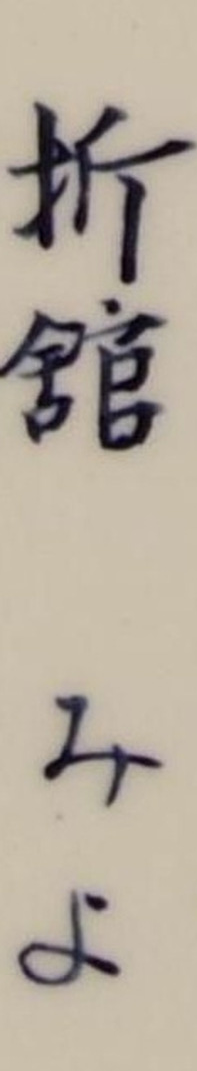折館みよ
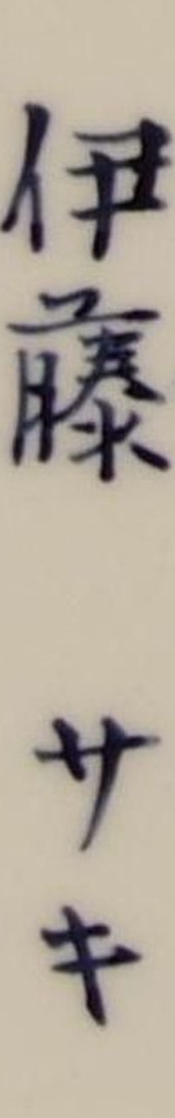伊藤サキ
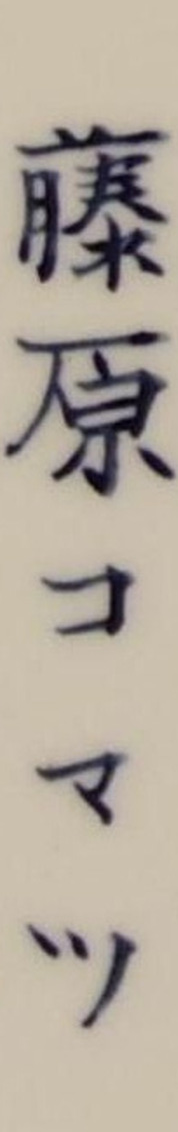藤原コマツ
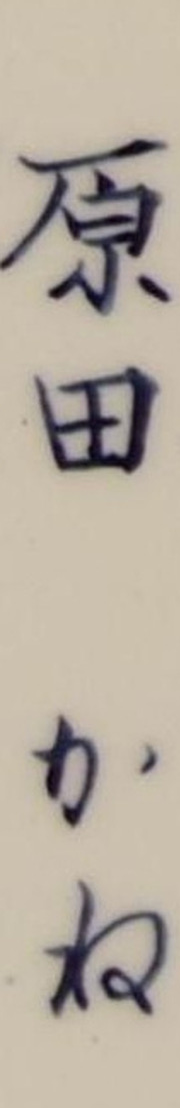原田かね
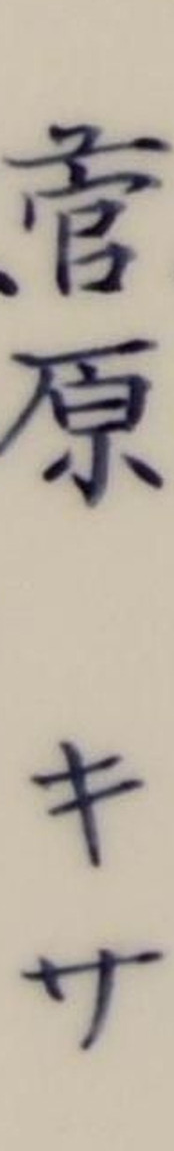菅原キサ
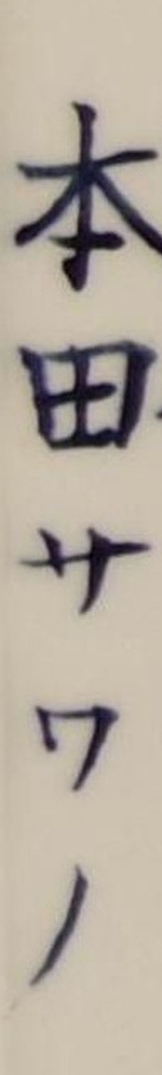本田サワノ

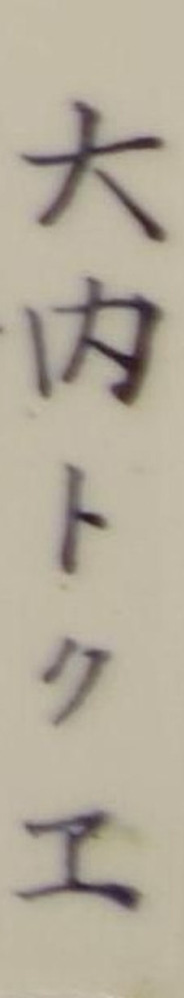大内トクエ
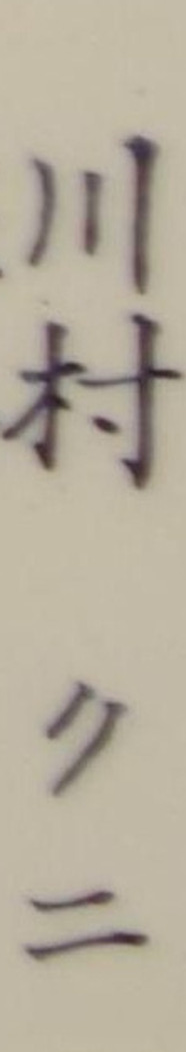川村クニ
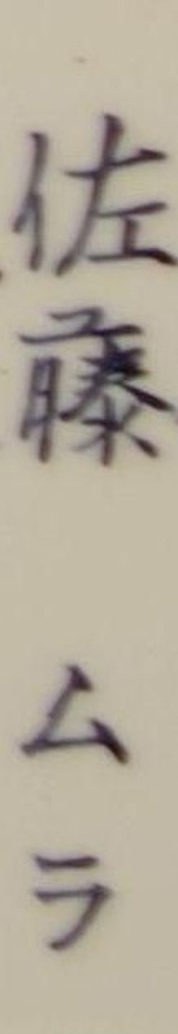佐藤ムラ
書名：M~S
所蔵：高野山金剛峯寺
